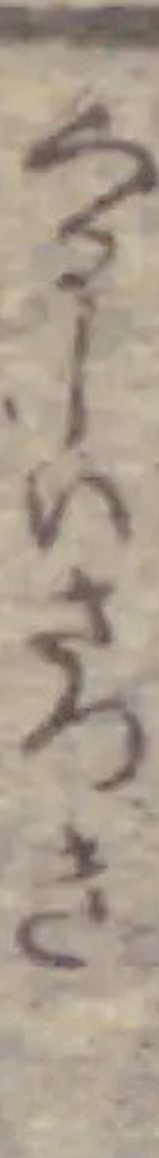くるしいさつき
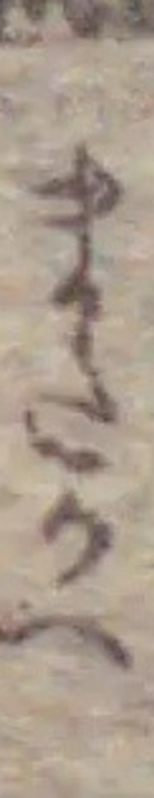またかへ
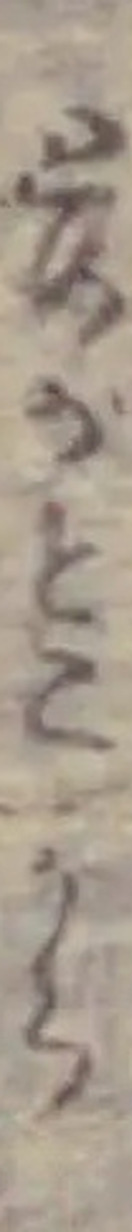とめがとこから
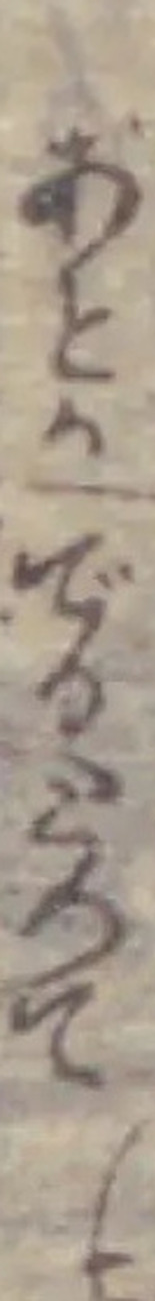あとかでるとかて
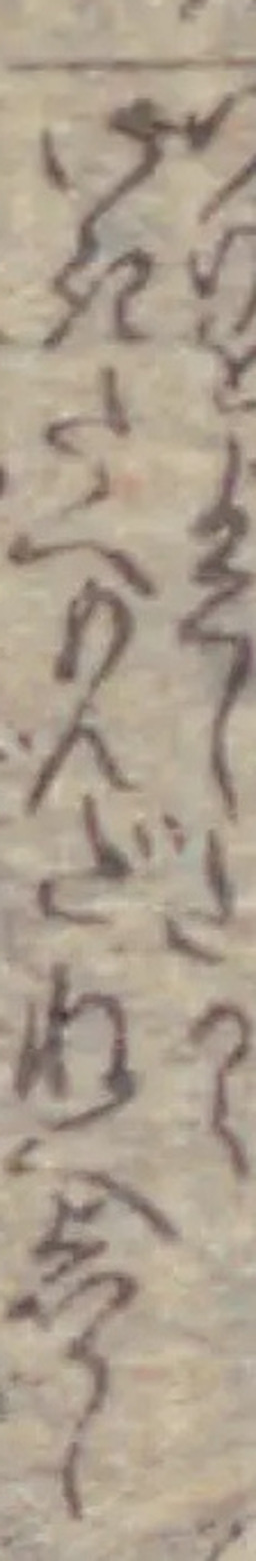いきたへもんだねへしかし
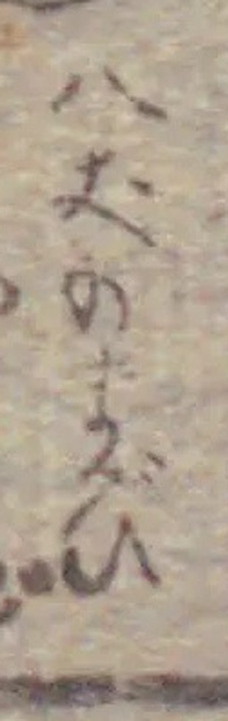八丈のまがひ
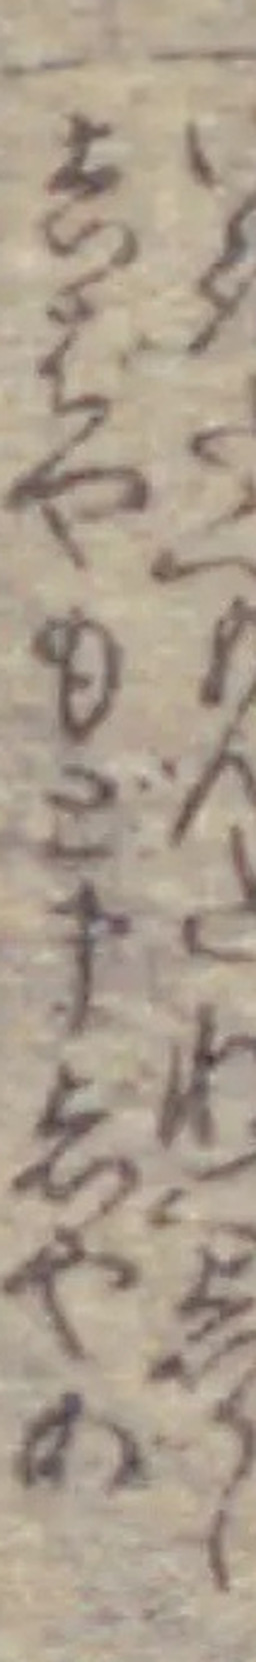しばやもどまじやあ
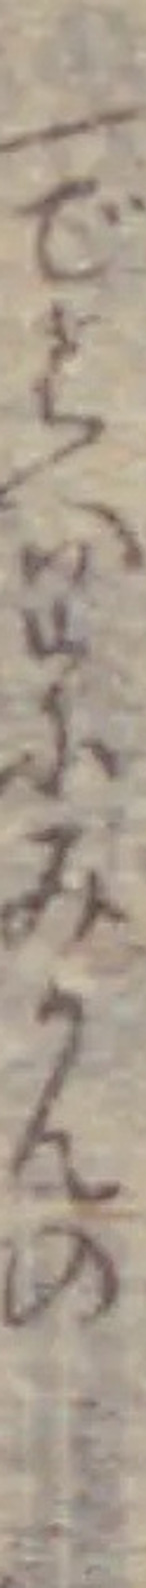ではへいらにみかんの
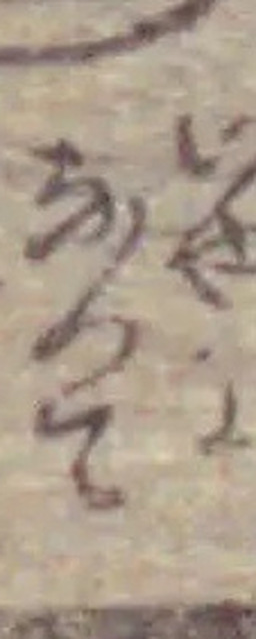なつて
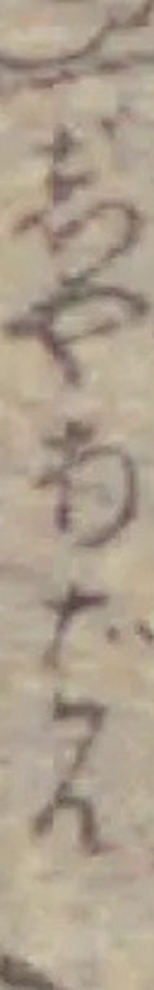じやあばん
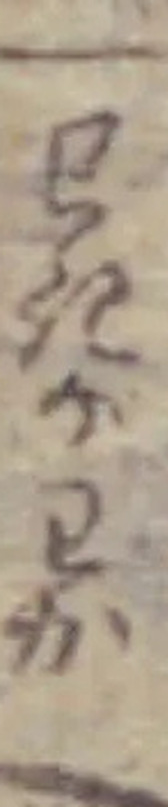せきがわか
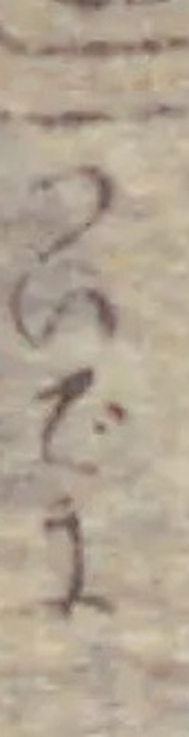ついでに
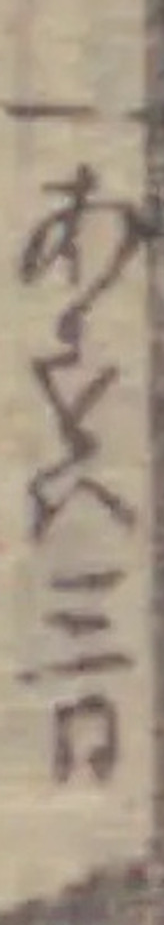あすは三口
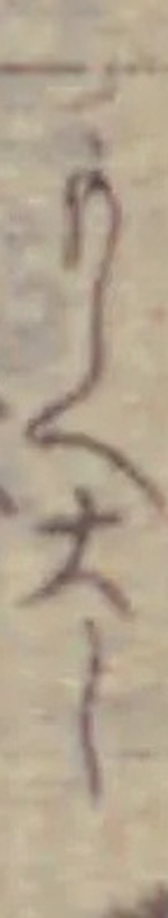もらへ大し
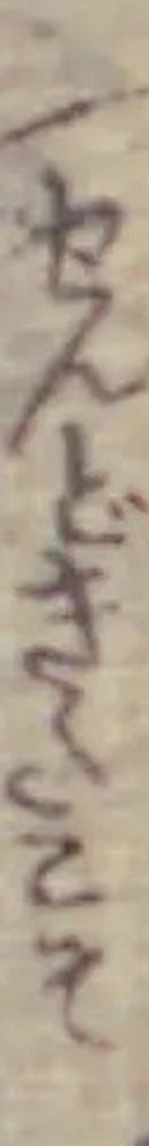せんどきたこそ
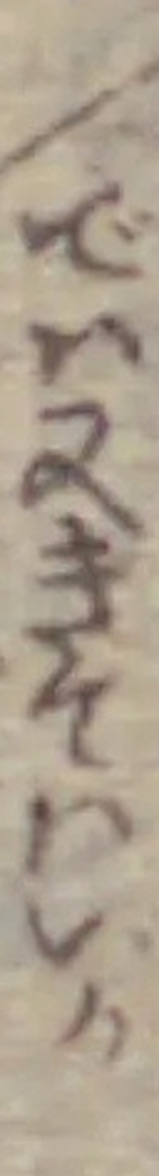では又きてはいか
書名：化物大閉口 2巻
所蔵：国立国会図書館 National Diet Library, JAPAN
